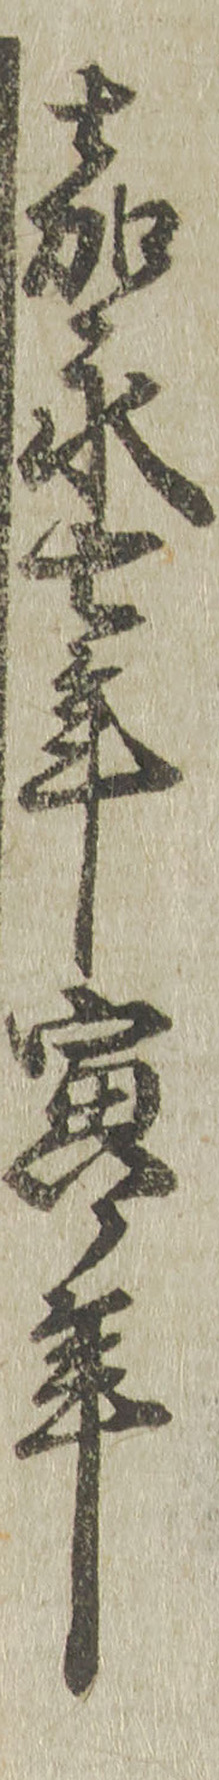嘉永七年寅ノ年
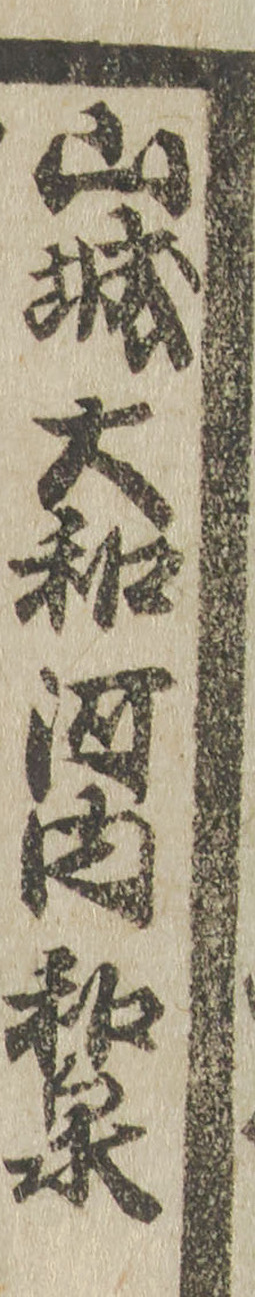山城大和河内和泉
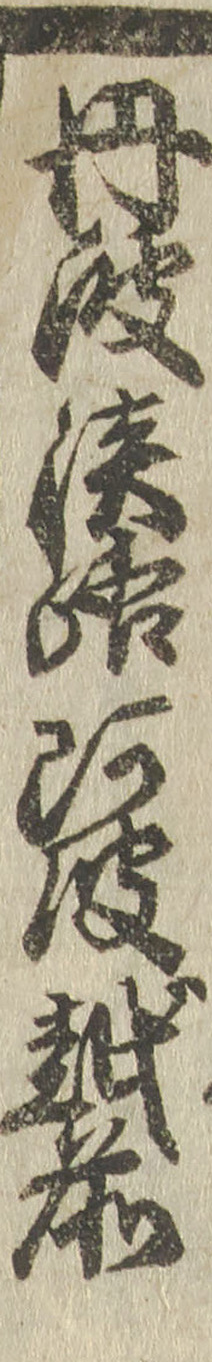丹波淡路阿波越前
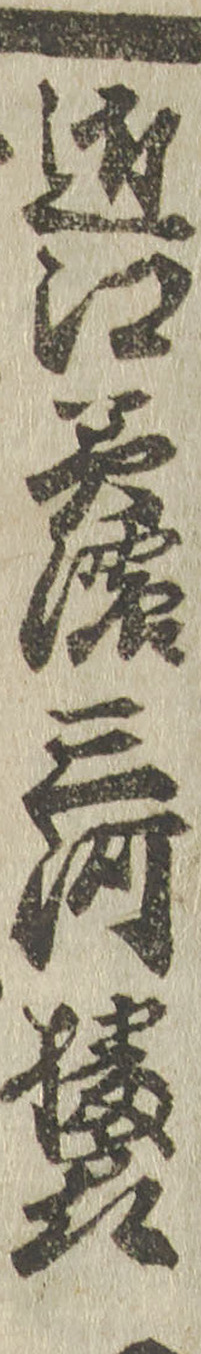近江美濃三河播州
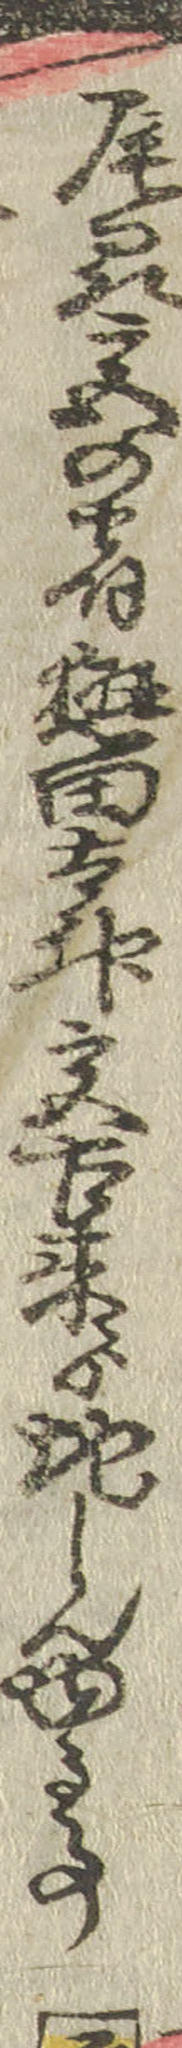尾州宮の宿熱田太神宮古来ゟ地しんゆる事
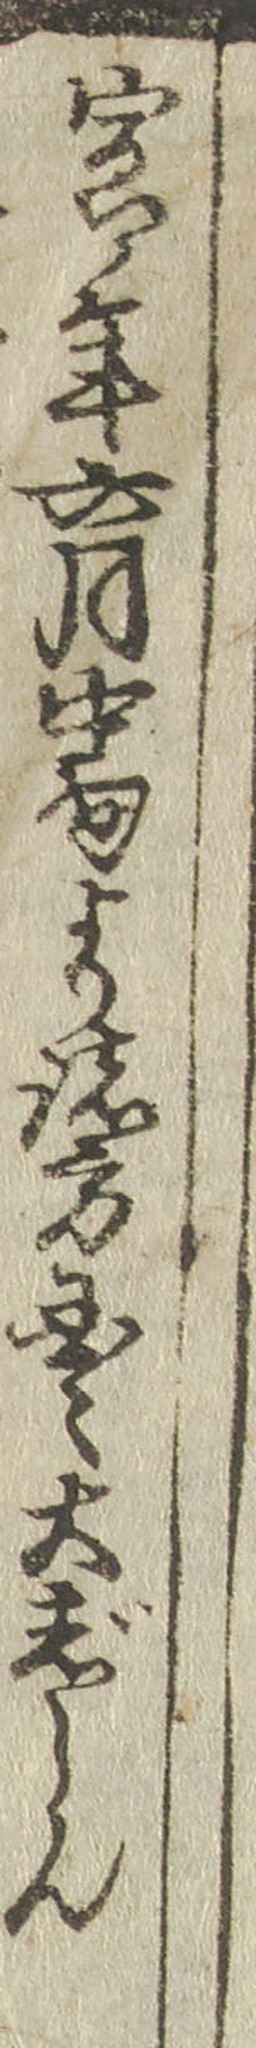寅ノ年六月中旬より諸方国〻大じしん
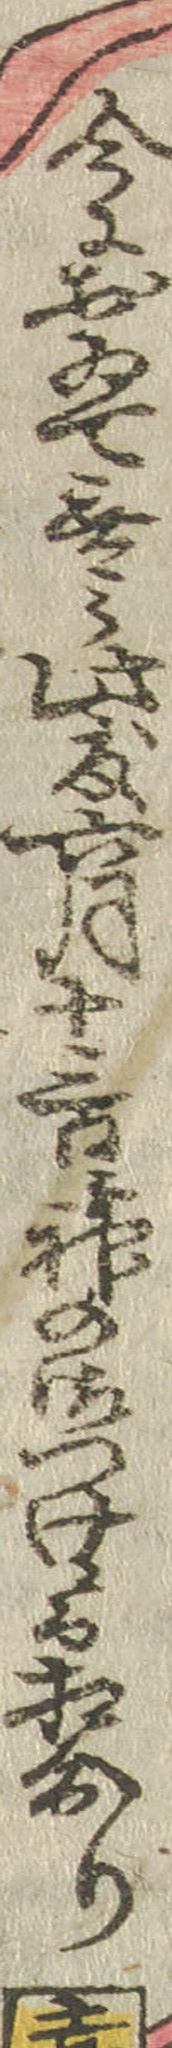今におゐて無之此度六月十三日神の御つけニ而相分り
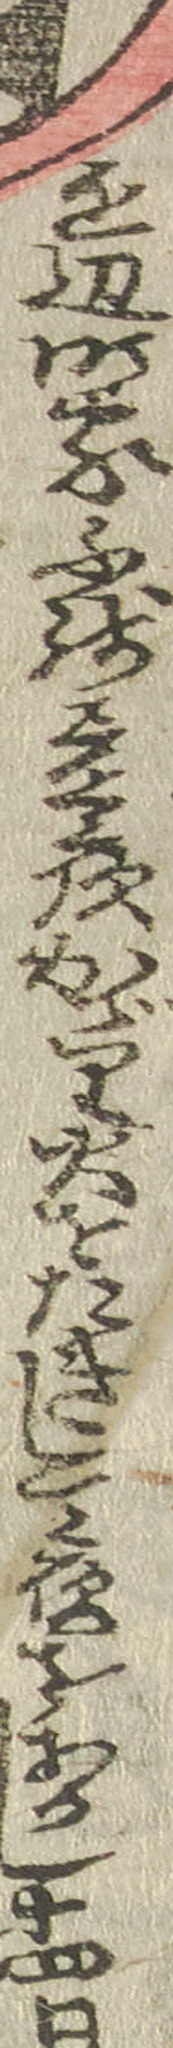近辺町家不残昼夜かゞり火をたきして夜をあかし十四日
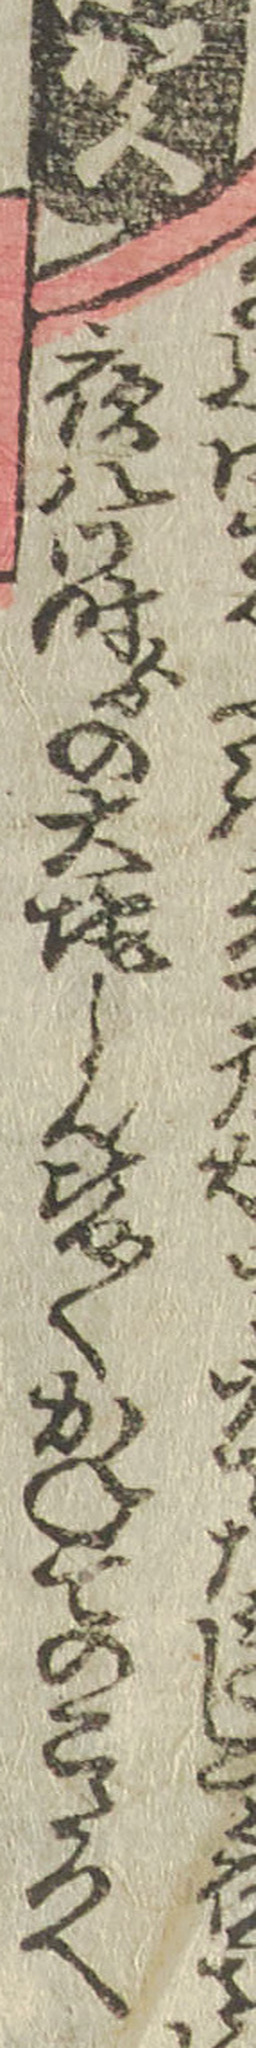夜八ツ時ゟの大地しん皆〳〵かねてのこゝろへ
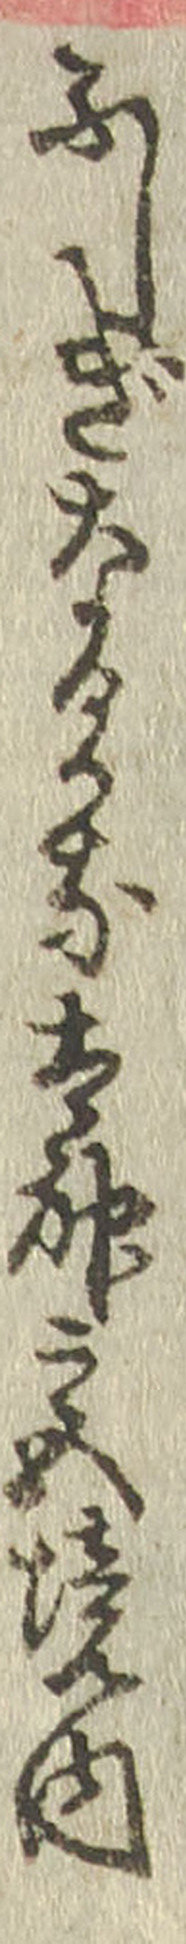ふしぎなるかな太神宮境内
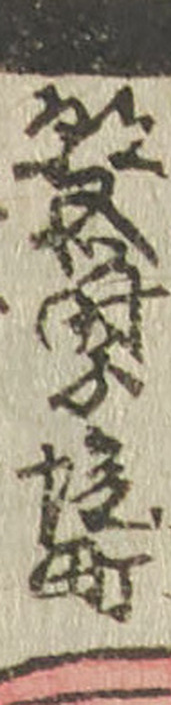朝五ツ時ゟ境町
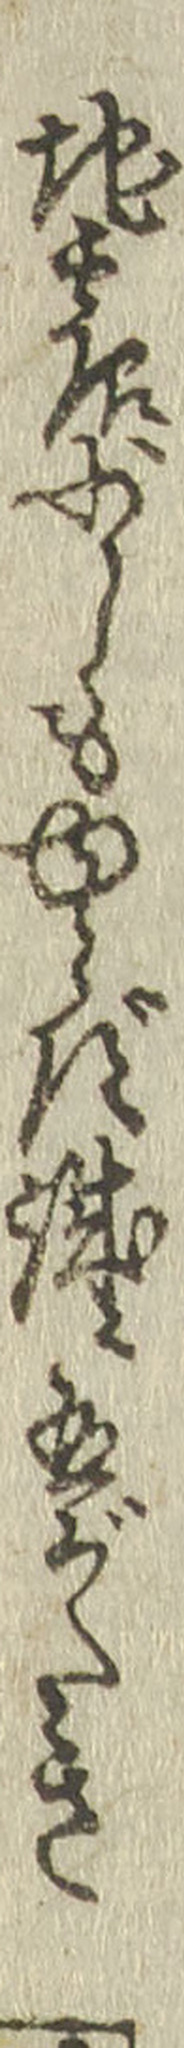地震少しもゆらず誠ニ有がたき
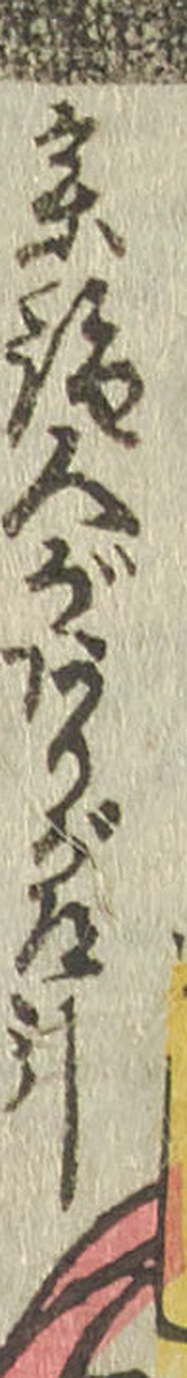参詣人がありが道引
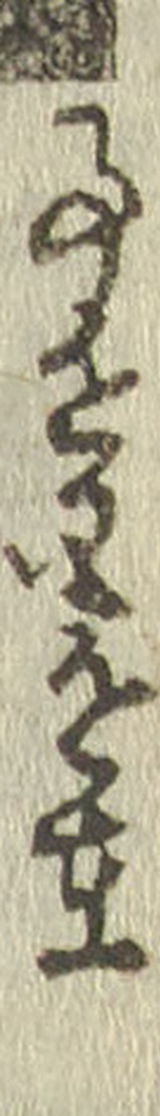事近国近在
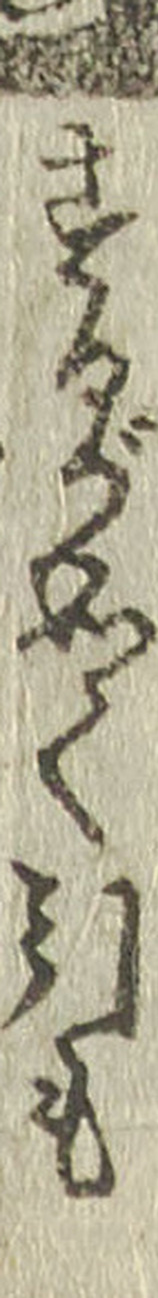するが如く引も
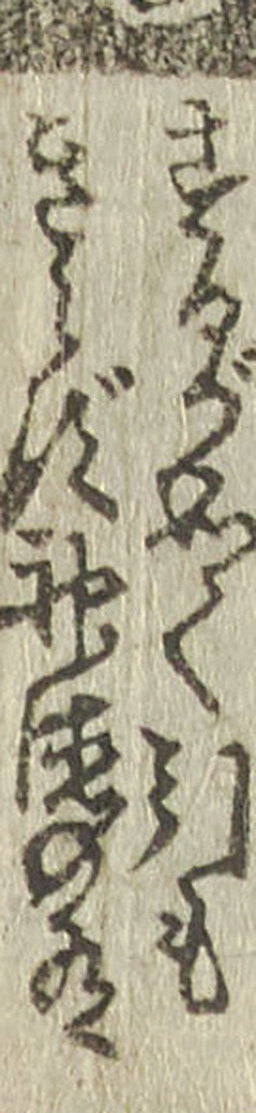きらず神徳の有
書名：大地震早引方角附
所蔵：東京大学総合図書館 General Library in the University of Tokyo, JAPAN
